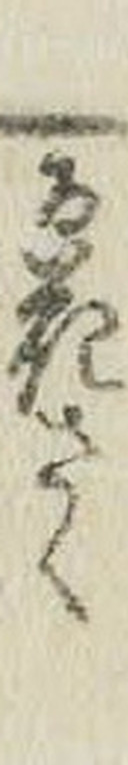る花さく
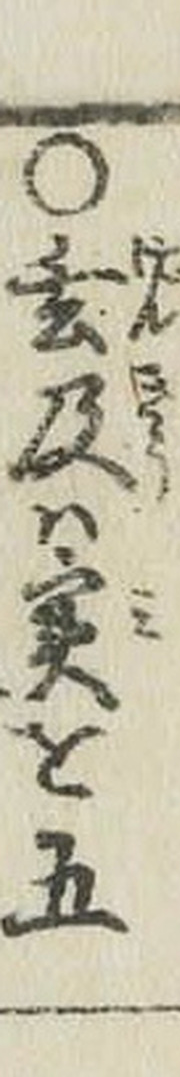○玄及は実を五
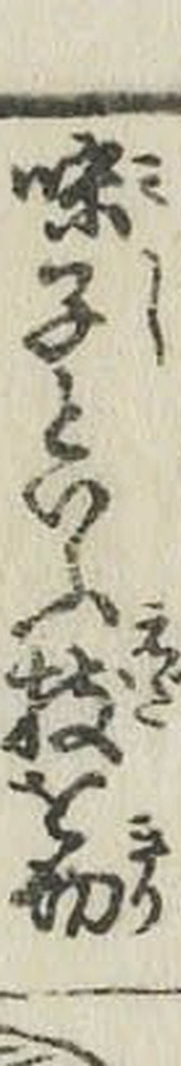味子といふ枝を切
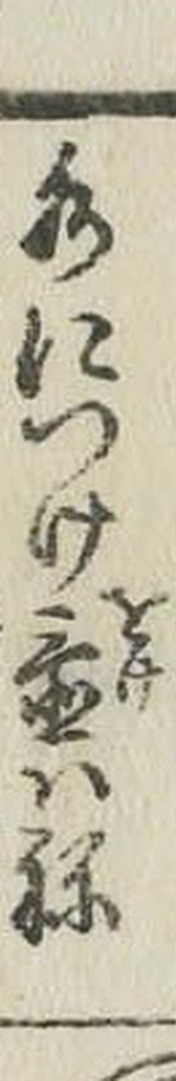水につけ置はね
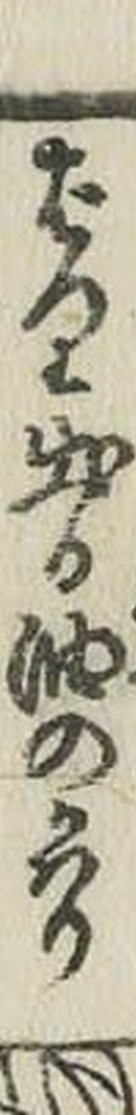ばり出る油のかはり
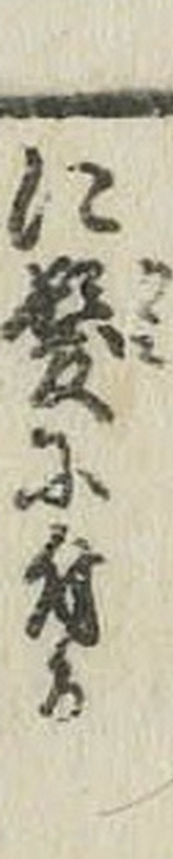に髪に付る
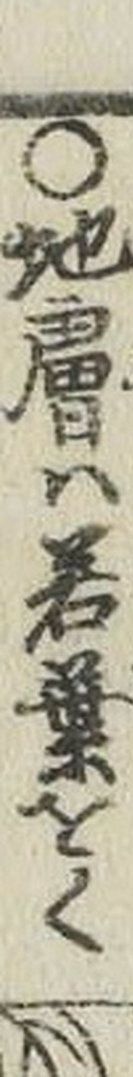○地膚は若葉をく
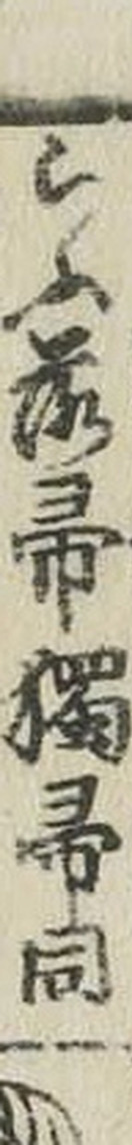らふ落帚独帚同じ
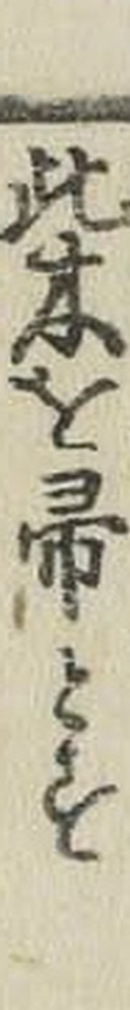此木を帚とす

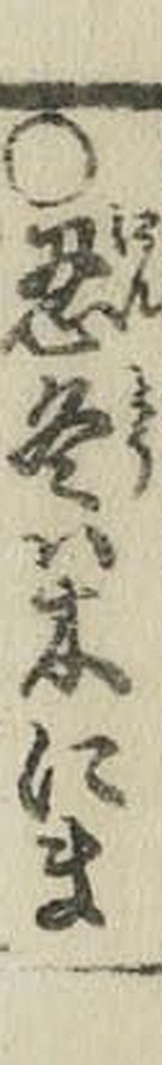○忍冬は木にま
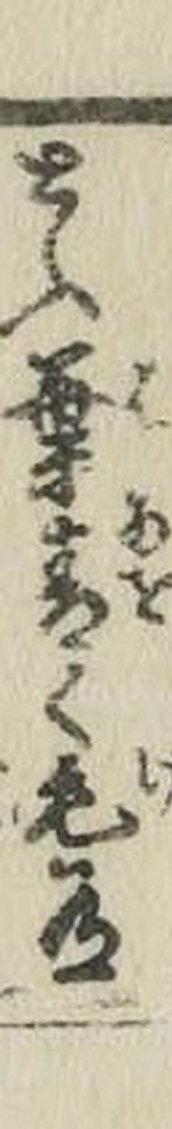とふ葉青く毛有
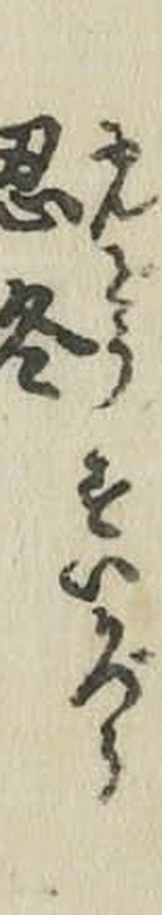忍冬すいかづら
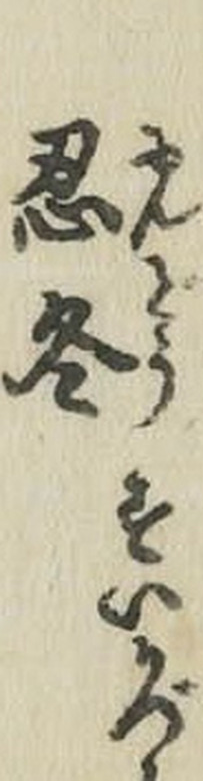忍冬すいかづら
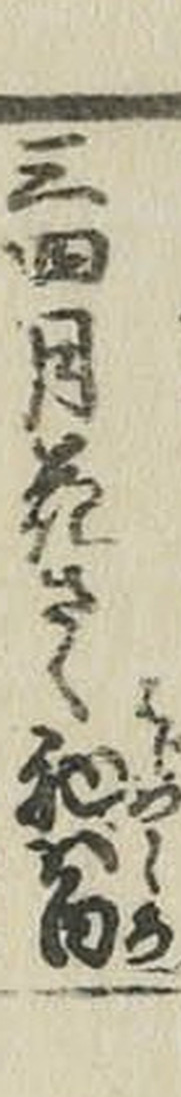三四月花さく初は白
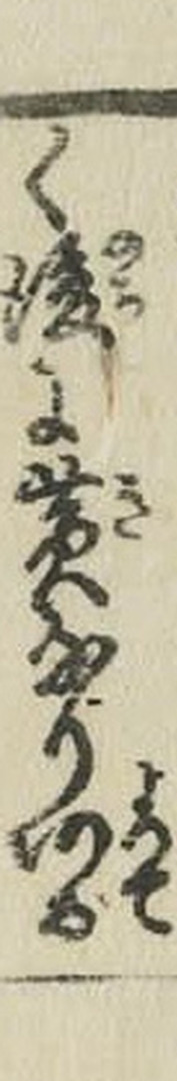く後に黄なり以為
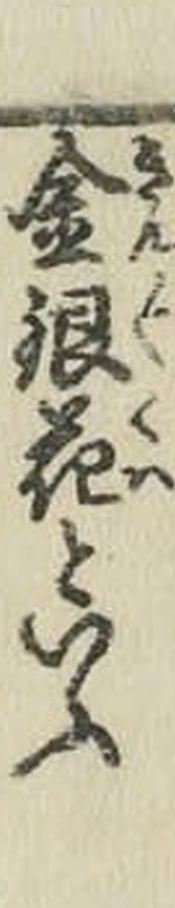金銀花といふ
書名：増補頭書訓蒙図彙大成 10巻 9:巻之20
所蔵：東京学芸大学教育コンテンツアーカイブ
